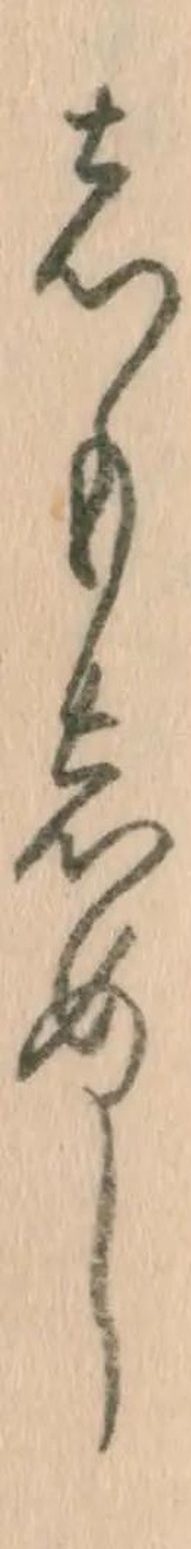しもしめし
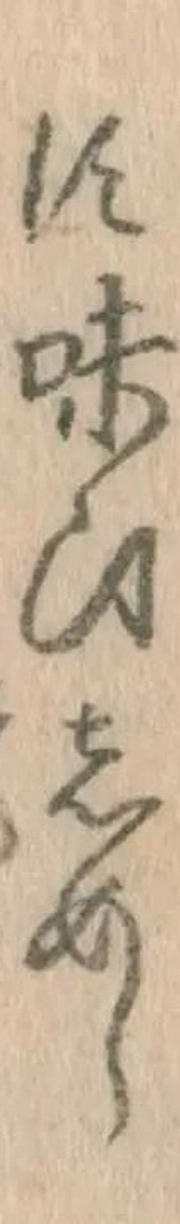す味ひしめし
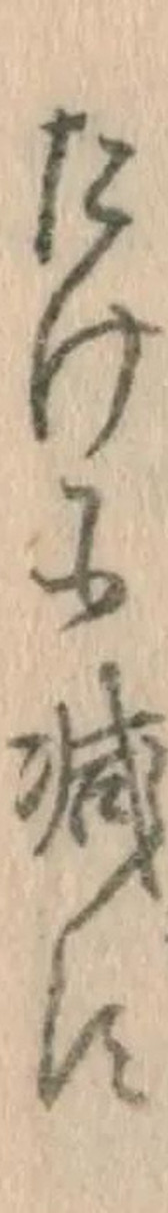たけに減す
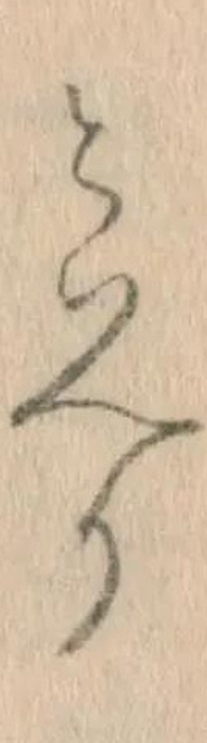といへり

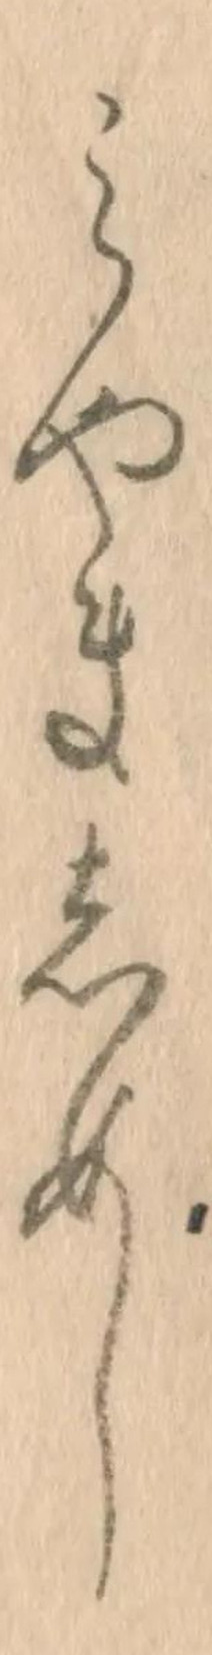みやましめし
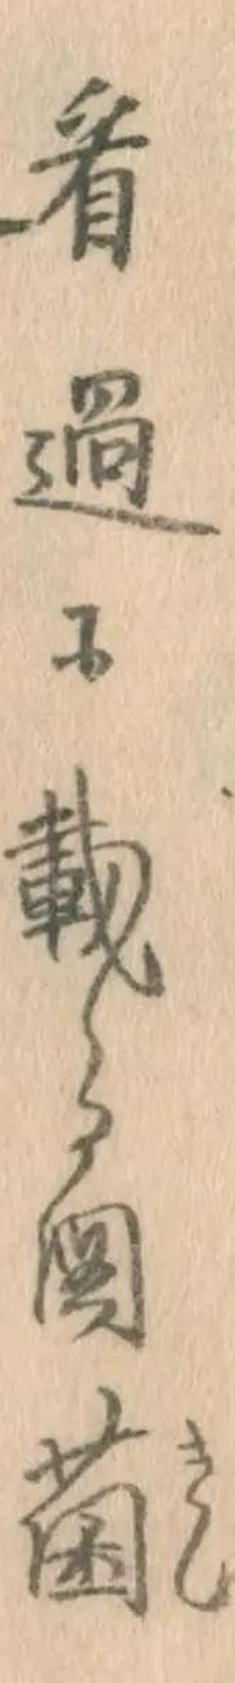看過に載る図菌
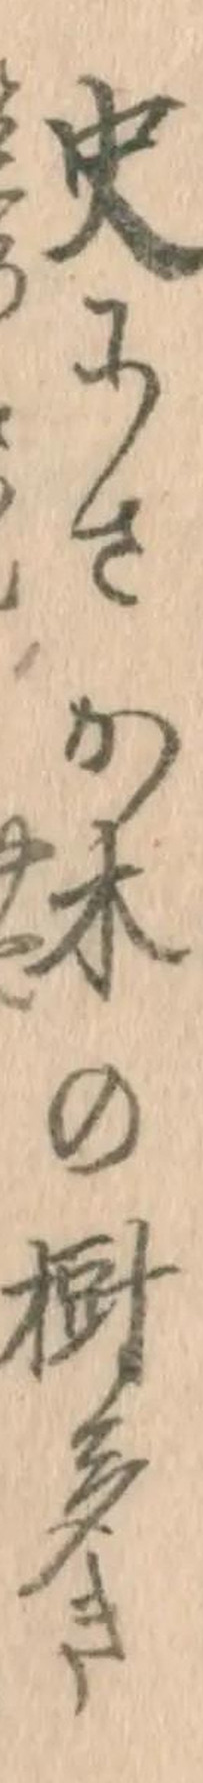史にさか木の樹多き
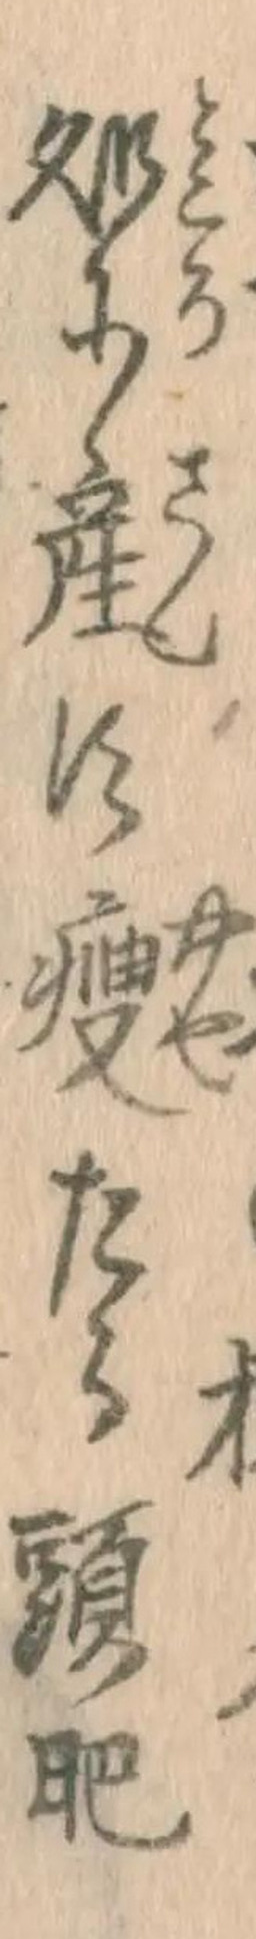処に産す痩たる頭肥
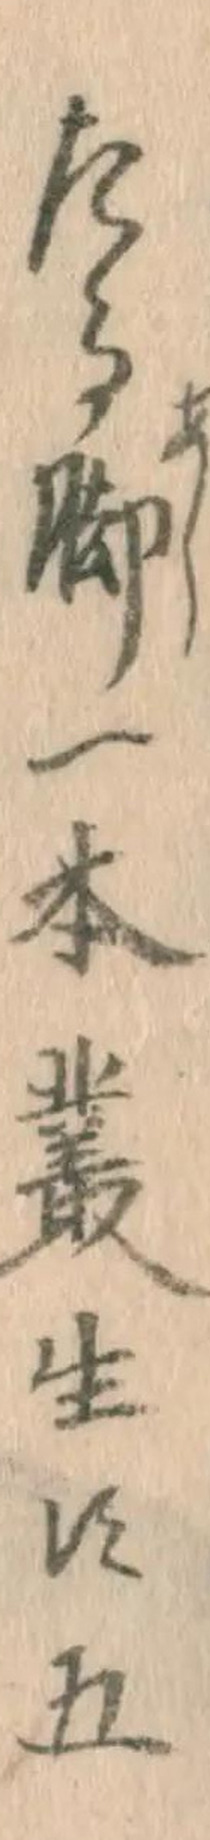たる脚一本叢生す五
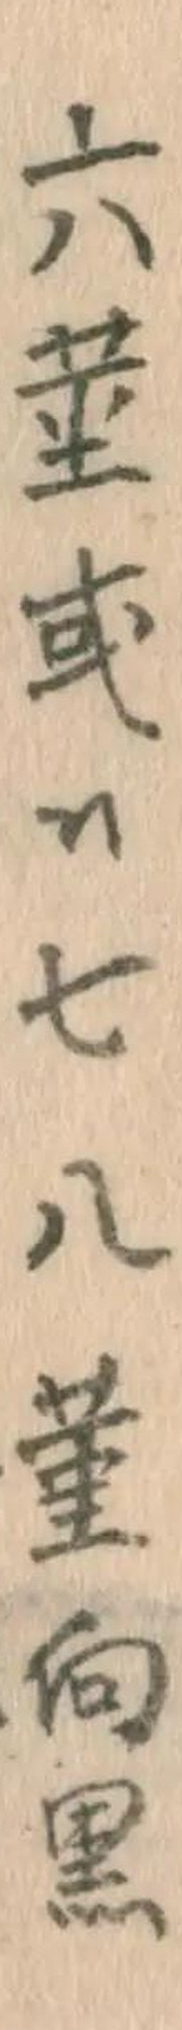六茎或は七八茎向黒
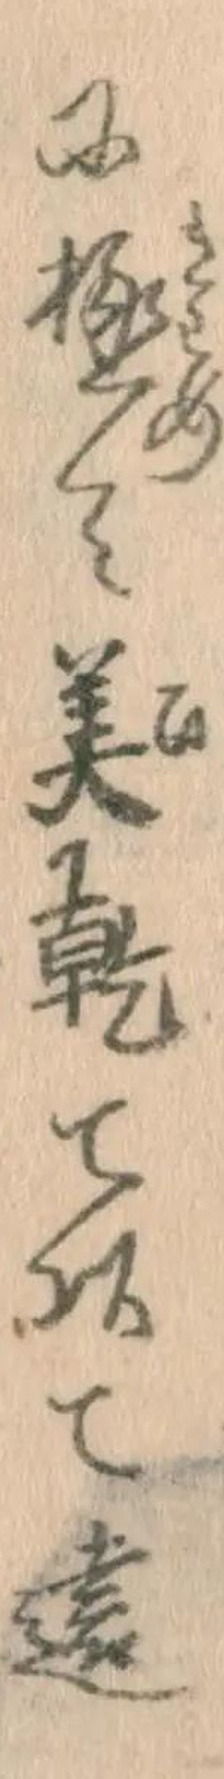に極て美乾て以て遠
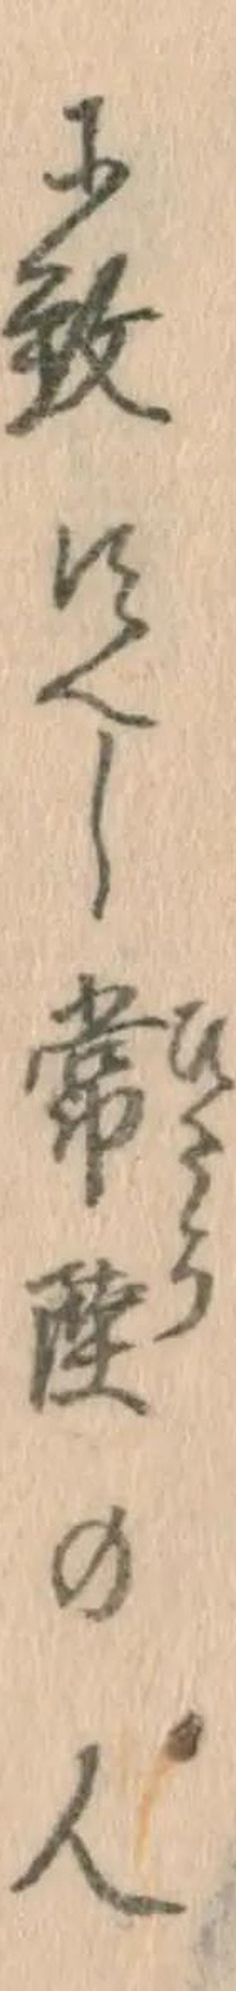に致すへし常陸の人
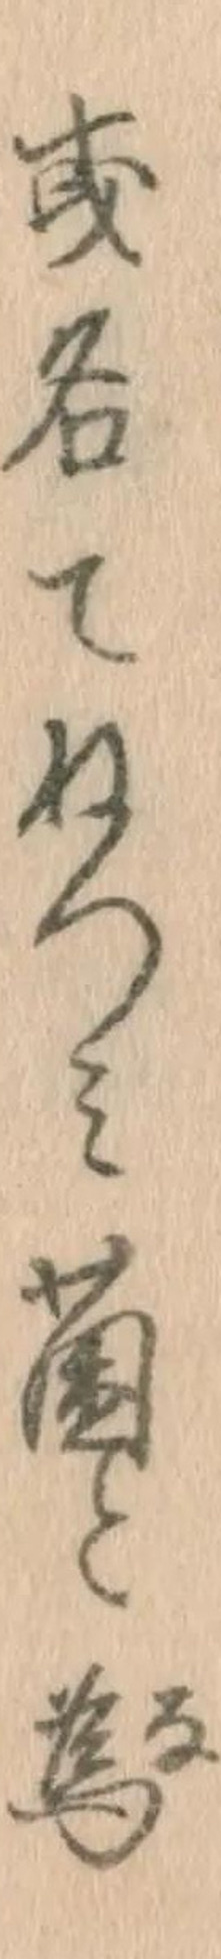或名てねつみ菌と為
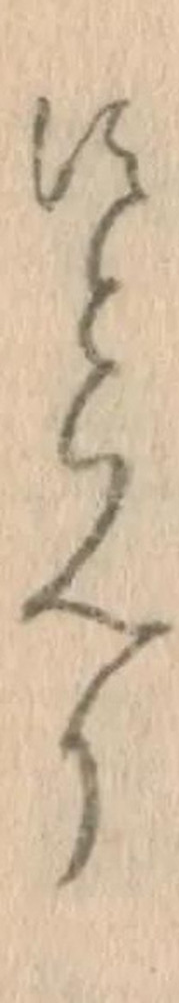すといへり
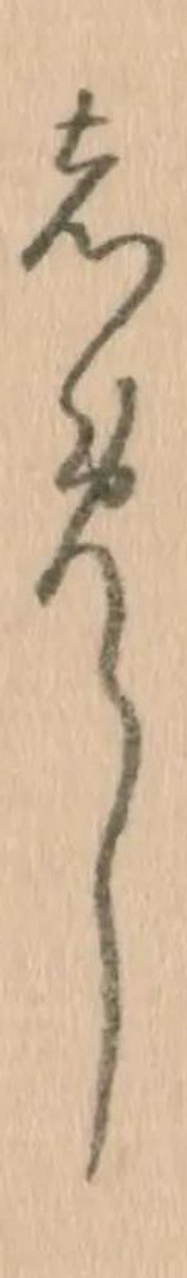しめし
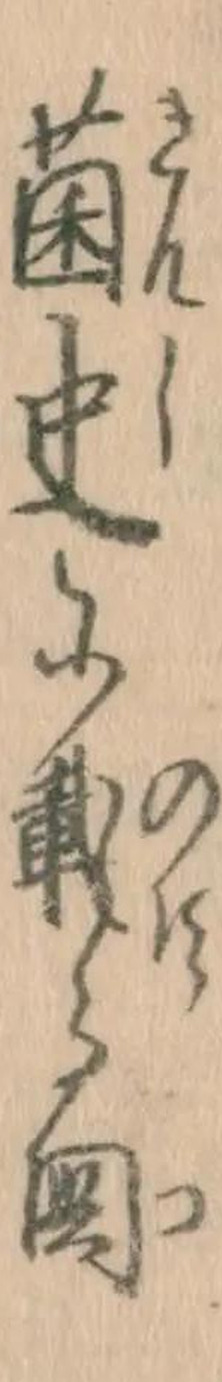菌史に載る図
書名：本草図譜. 巻55-57
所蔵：国立国会図書館 National Diet Library, JAPAN
